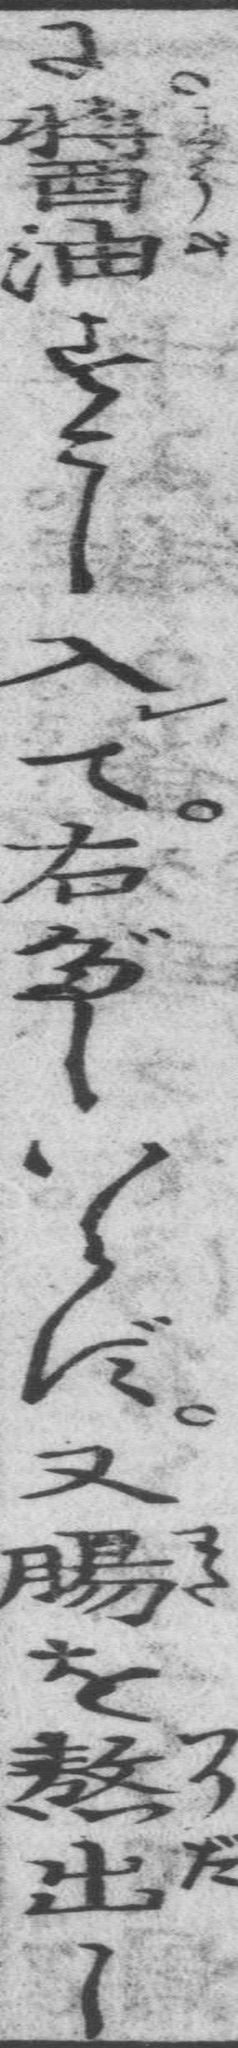に。醤油すこし入れて。右だしいらず。又腸を熬出し
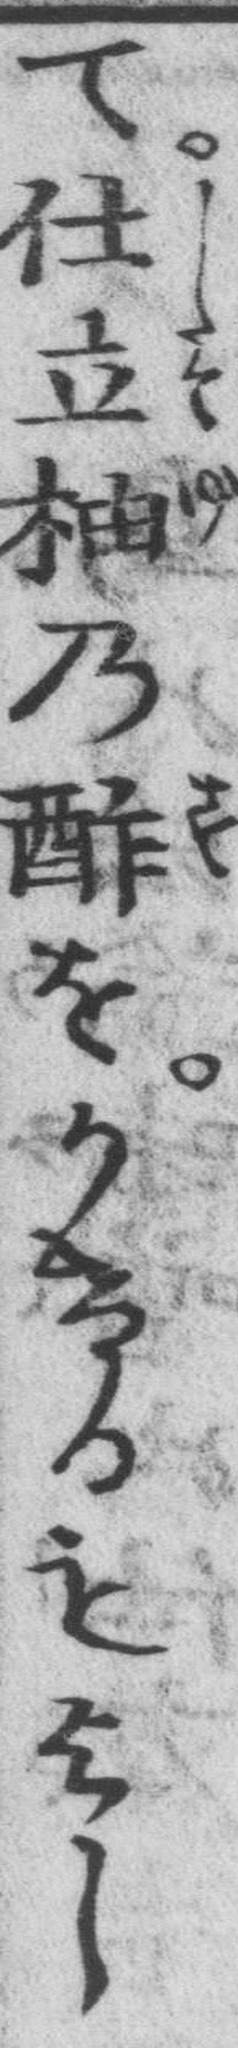て。仕立柚の酢を。かけるもよし
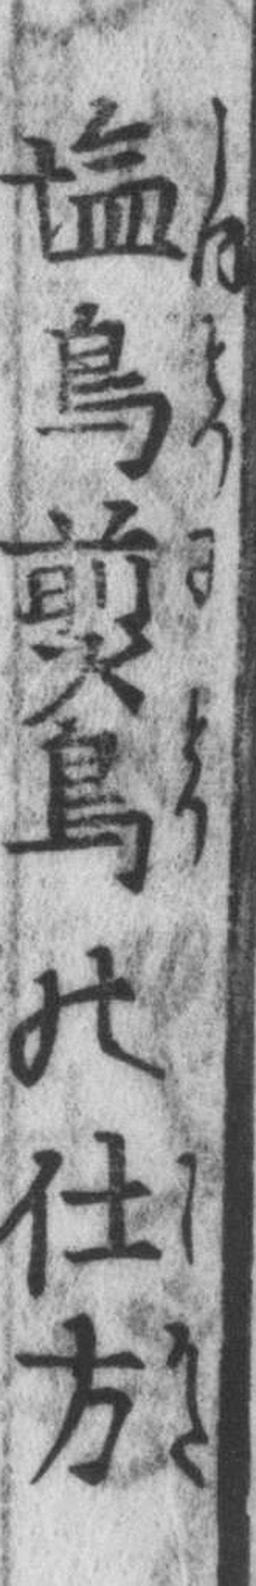塩鳥煎鳥の仕方
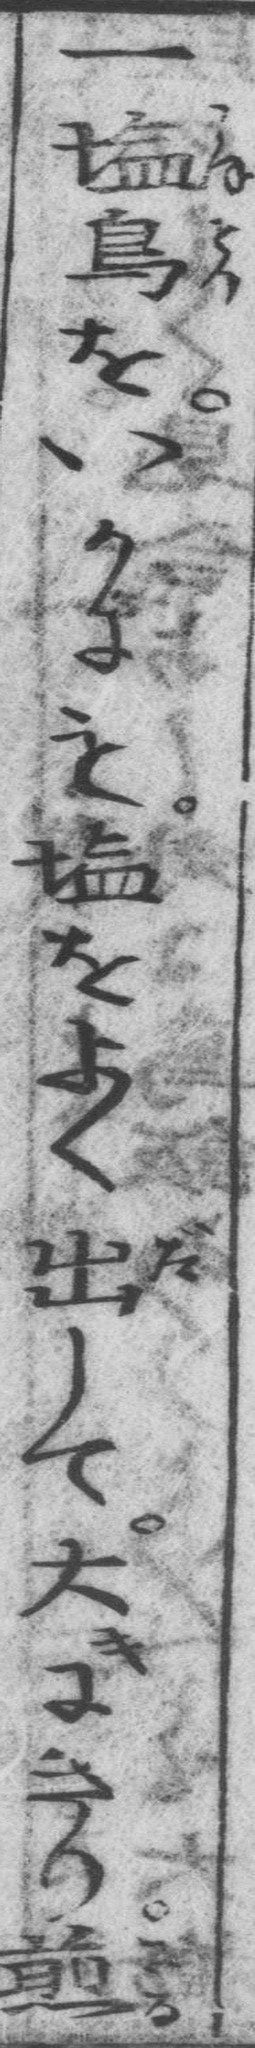一塩鳥を。いかにも。塩をよく出して。大きにきり。煎
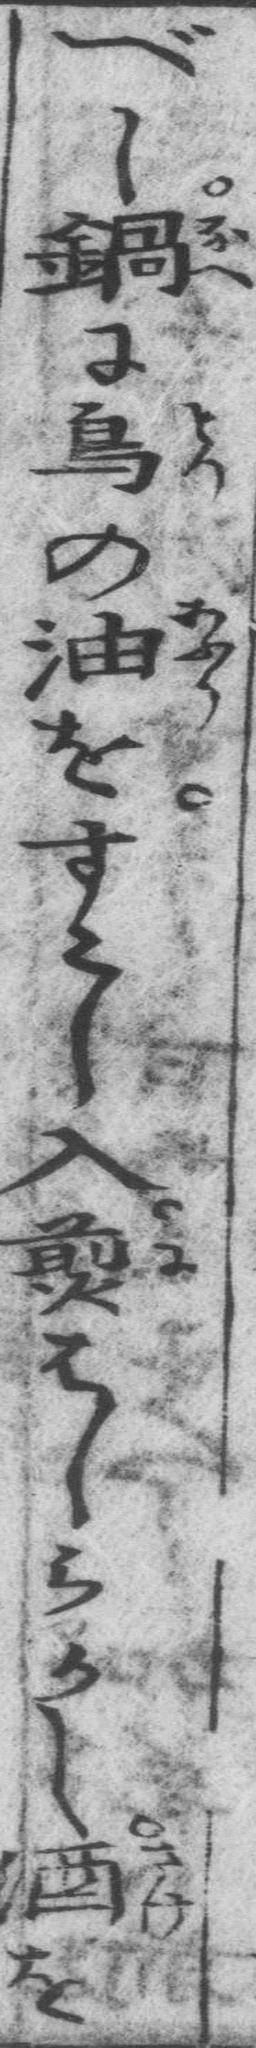べし。鍋に鳥の油を。すこし入。煎はしらかし。酒を
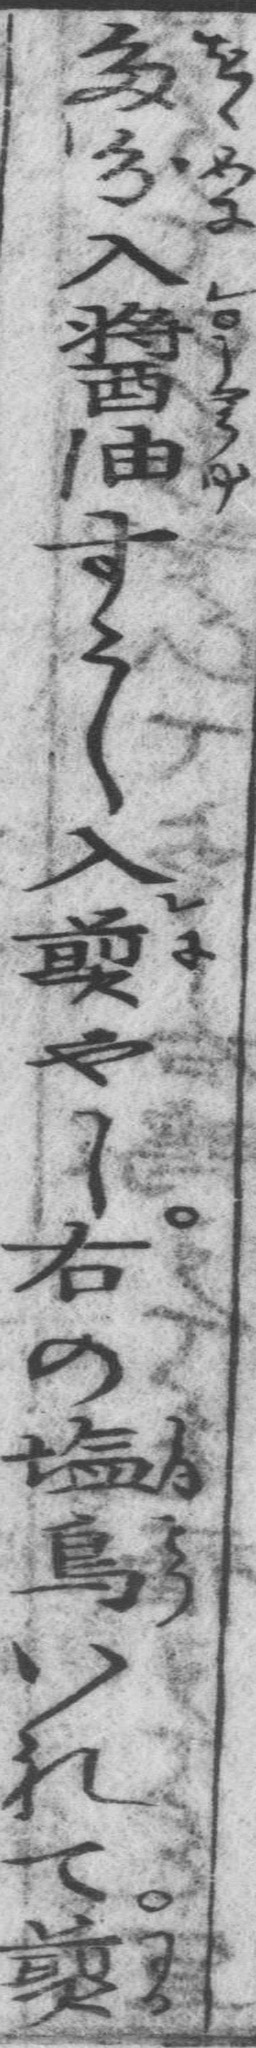多分入れ醤油すこし入れ煎やし。右の塩鳥いれて。煎
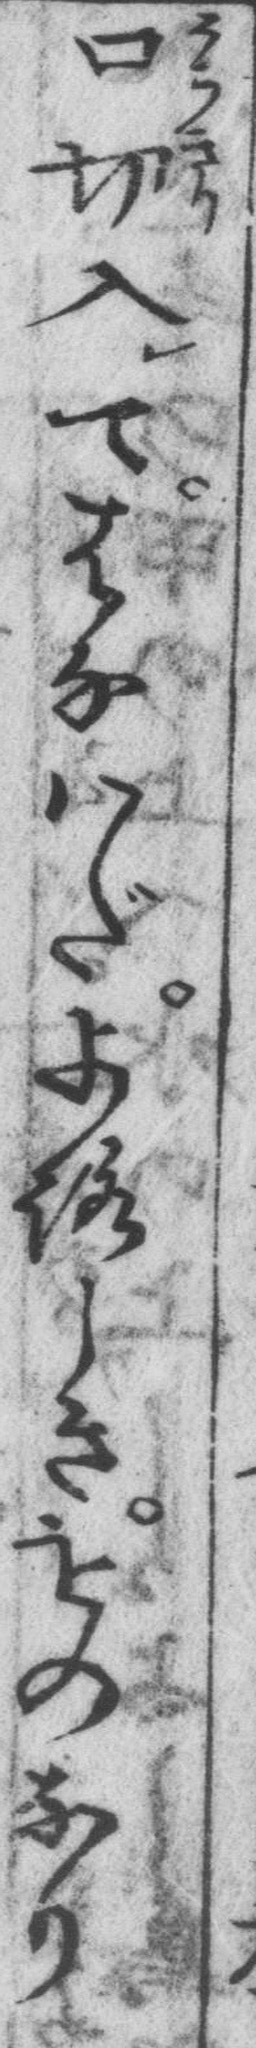口切入れて。はなはだ。よろしき。ものなり
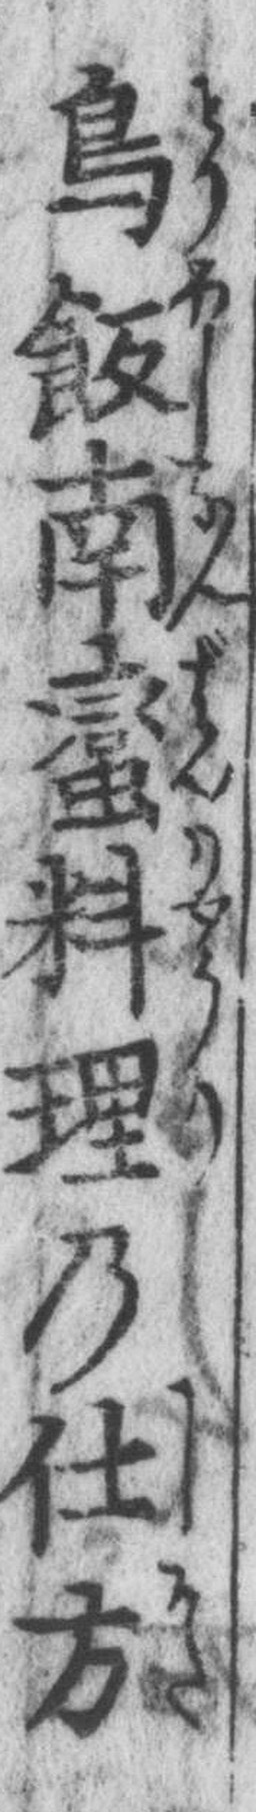鳥飯南蛮料理の仕方
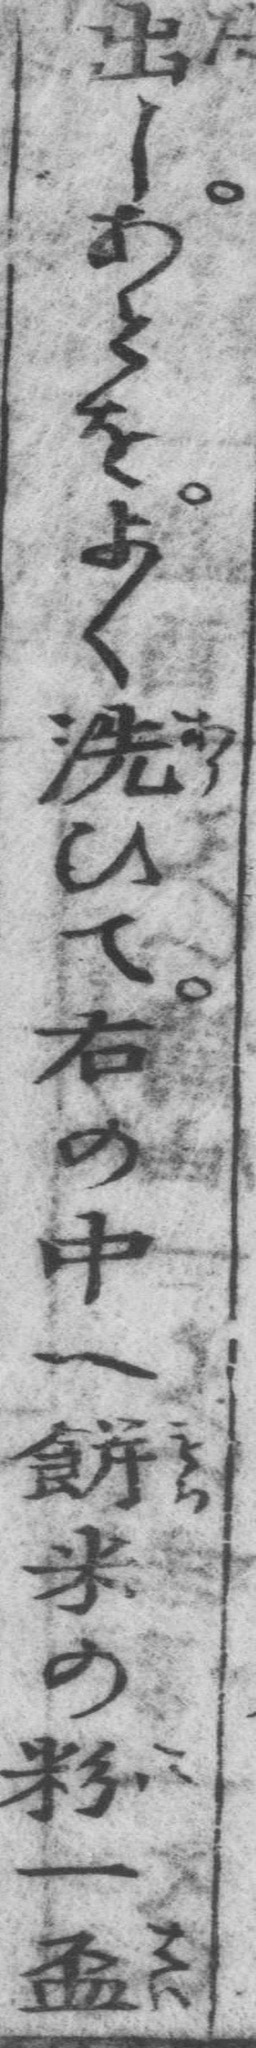出し。あとを。よく洗ひて。右の中へ餅米の粉一盃

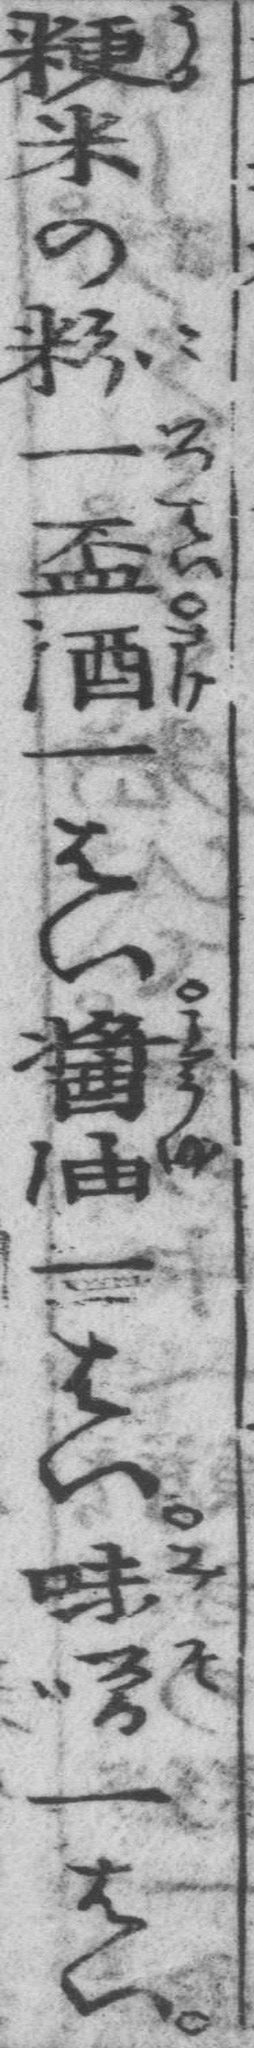粳米の粉一盃。酒一はい。醤油一はい。味噌一はい。
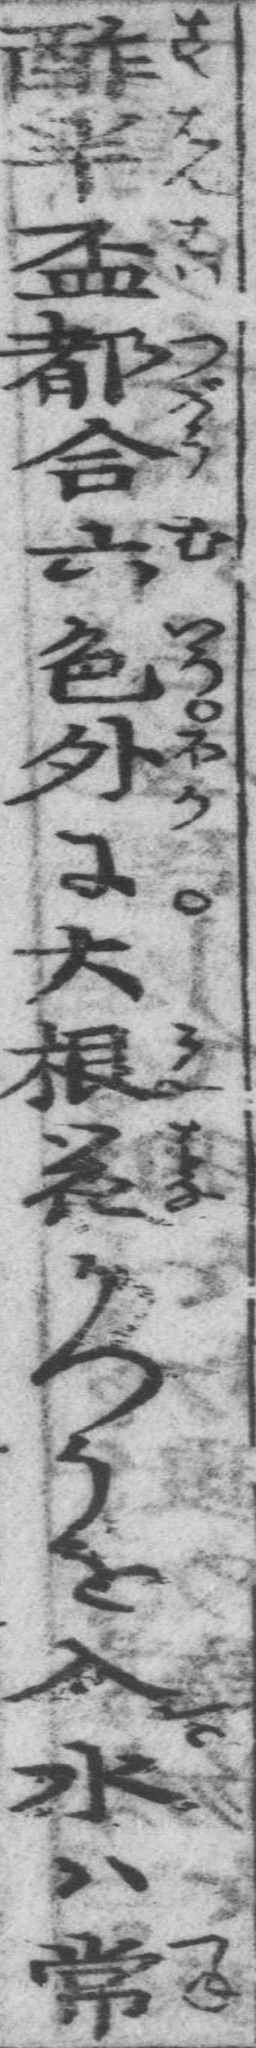酢半盃都合六色。外に。大根花かつうを入れ。水は常
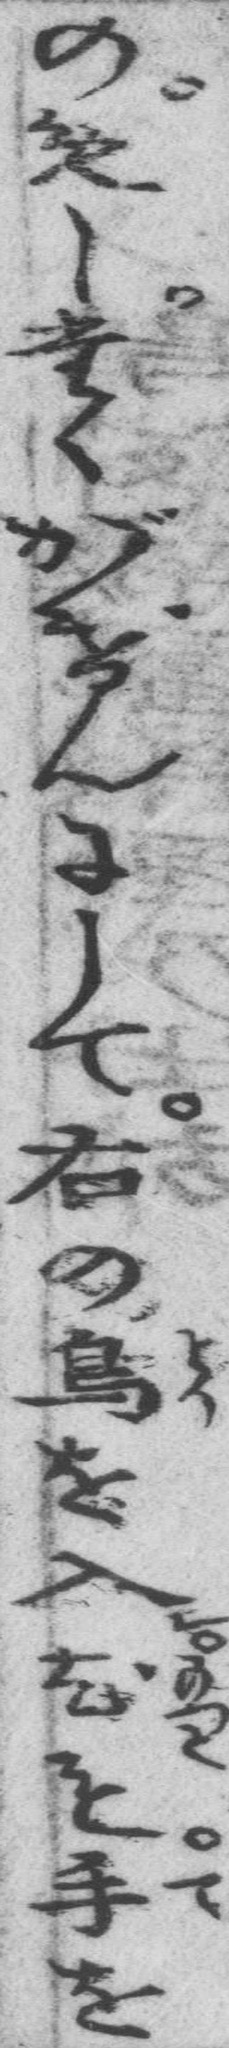の。めし。たくがけんにして。右の鳥を入れ。尤も。手を
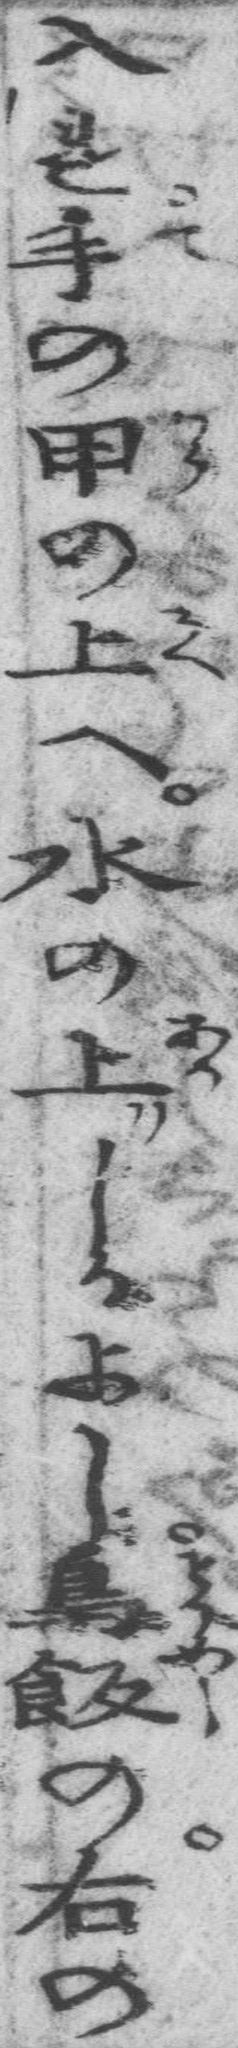入れ。手の甲の上へ。水の上りしかよし。鳥飯の。右の
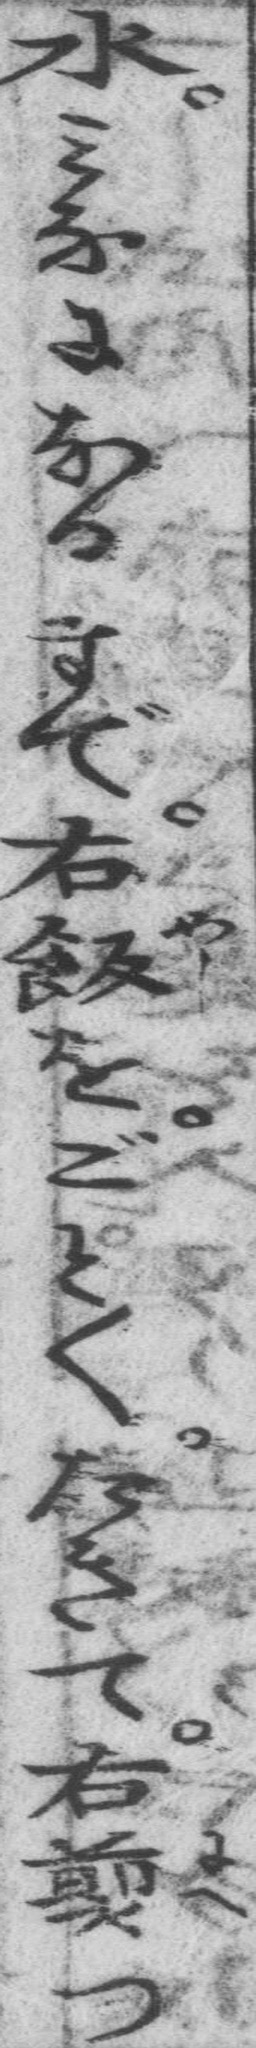水。みなになるまで。右飯を。ごと〳〵。たきて。右煎つ
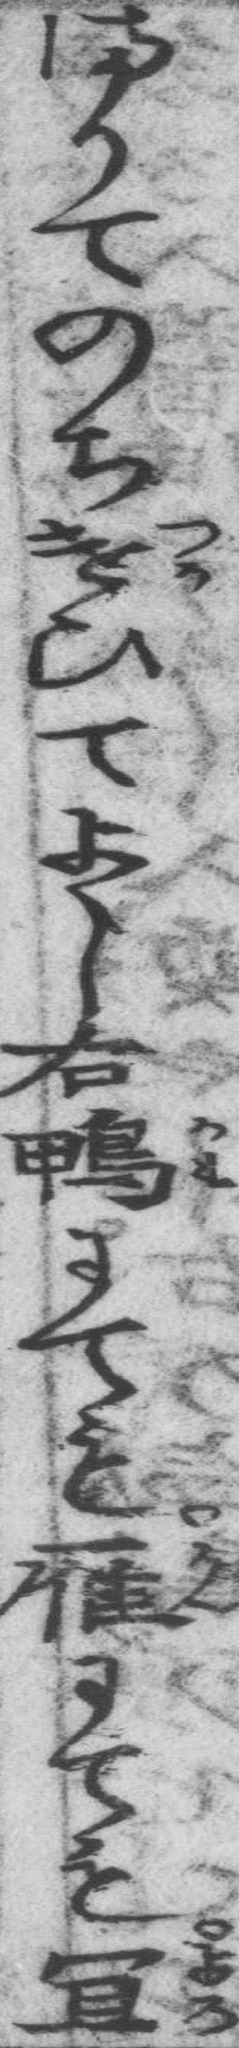まりてのち遣ひてよし右鴨にても。雁にても。宜
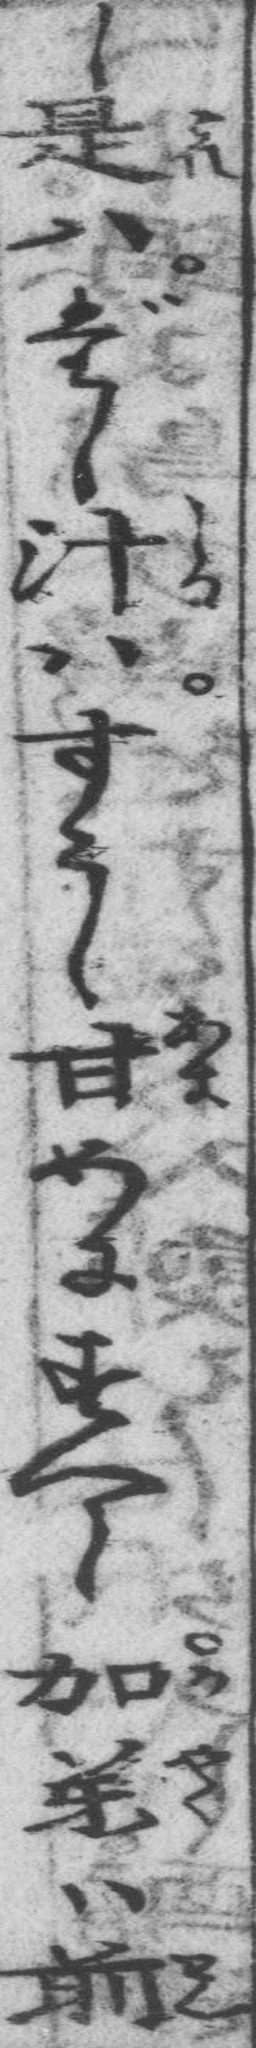し是は。だし汁は。すこし甘めにすへし。加薬は前
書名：萬寳料理秘密箱
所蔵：大阪府立大学学術情報センター 国文学研究資料館
